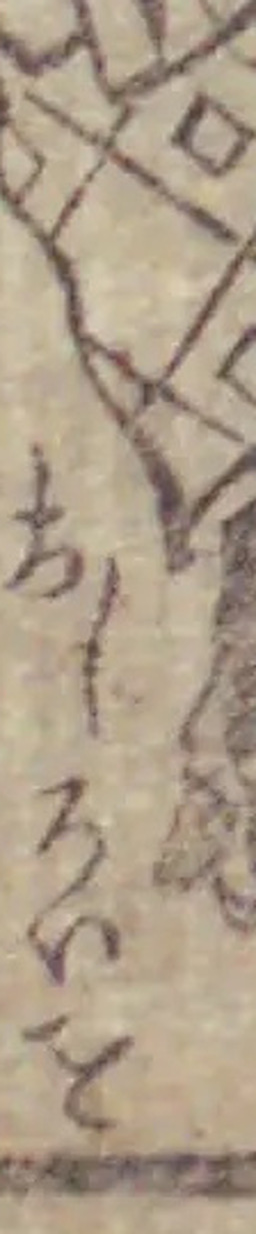おしろいを
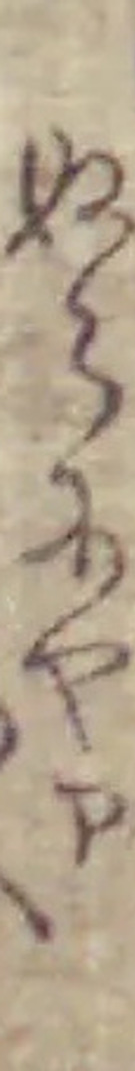ぬらふやァ
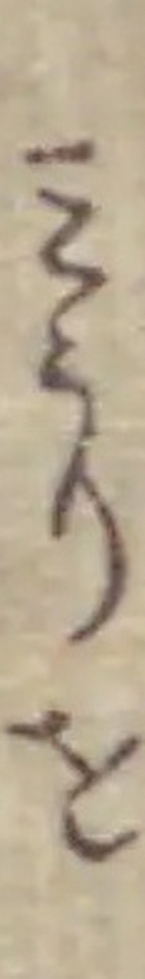みうりを
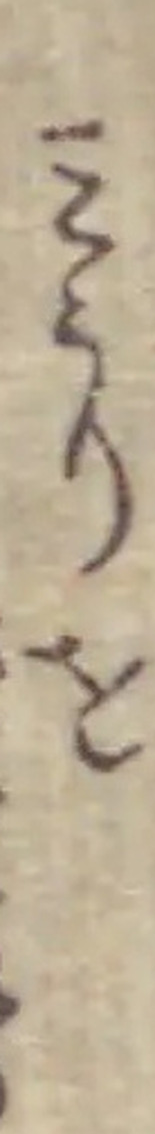みうりを
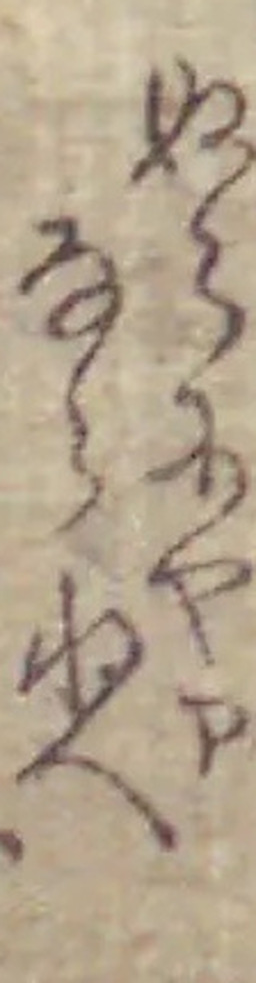ならねへ
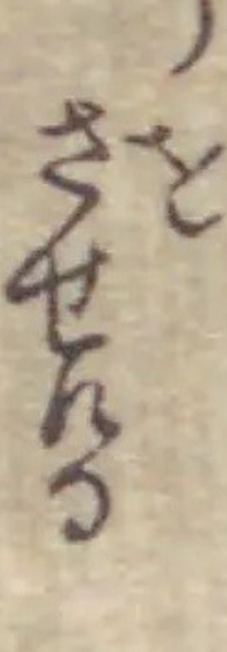させける
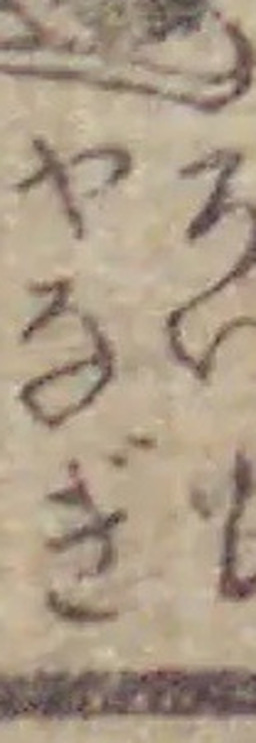やなぎ
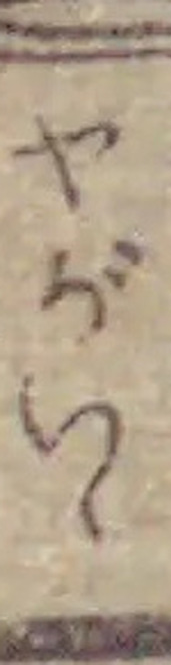やがいゝ

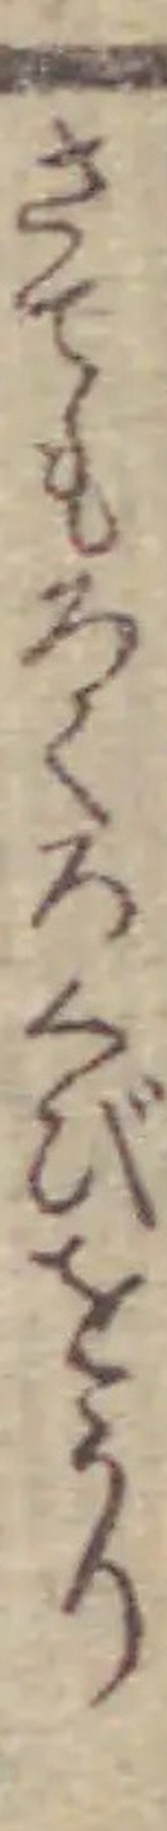さてもろくろくびをうり
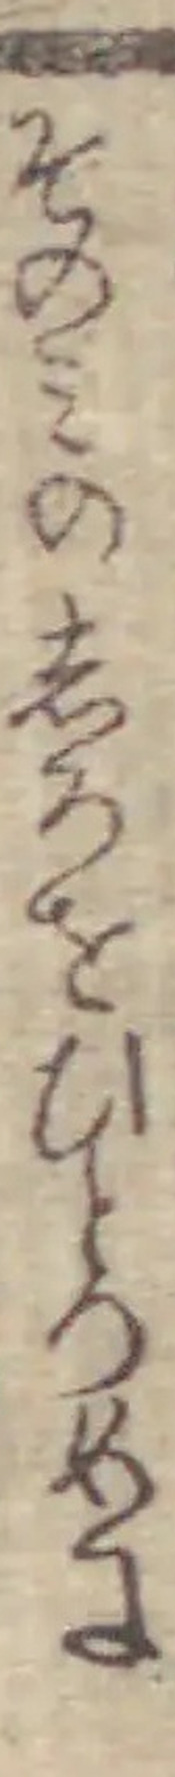そのみこしろをひとつめに
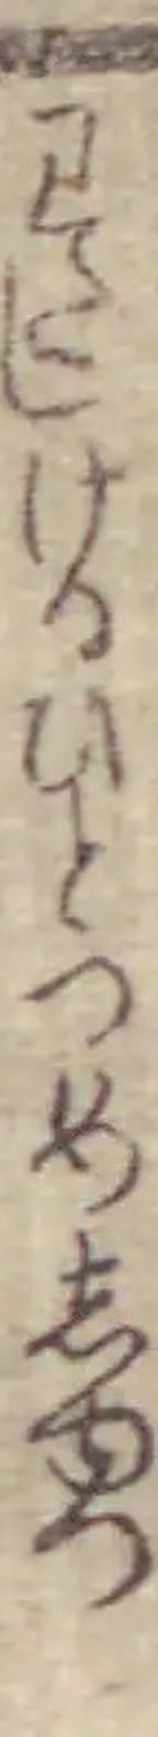わたしけるひとつめしゆつ
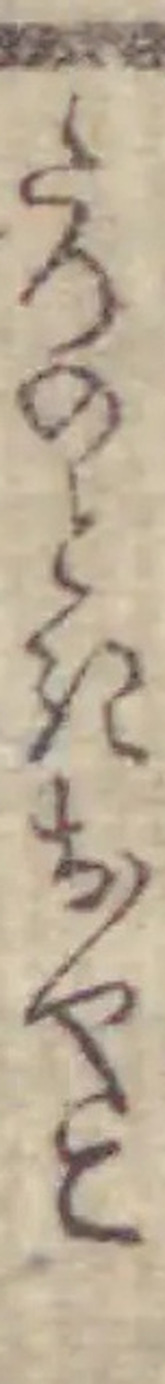たつのときおやこ
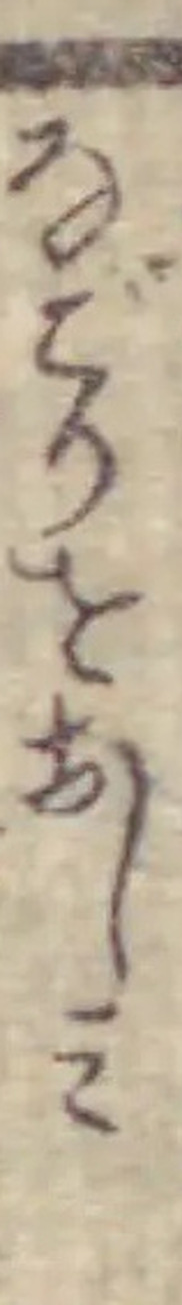なごりをおしみ
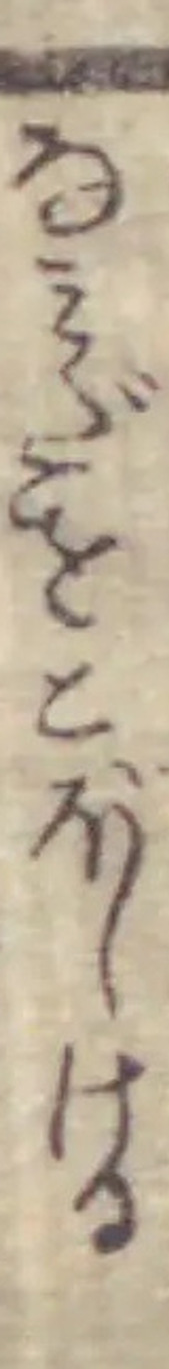なみだをこぼしける
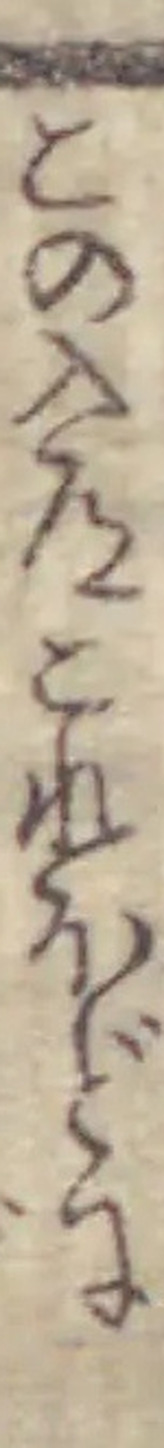この入道これほどに
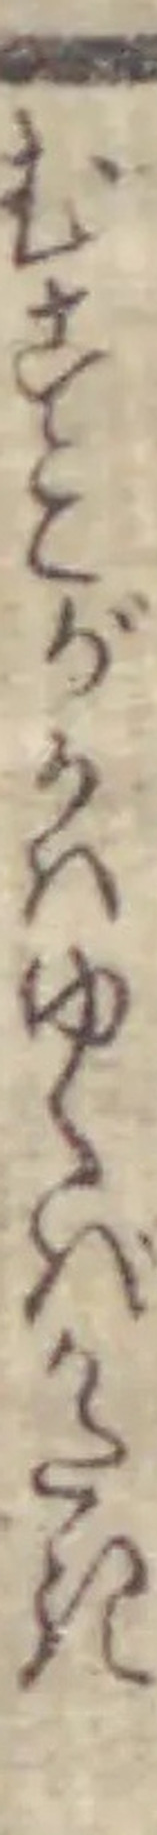むすこがかはゆくばかたき
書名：化物敵討 2巻
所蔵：国立国会図書館 National Diet Library, JAPAN
